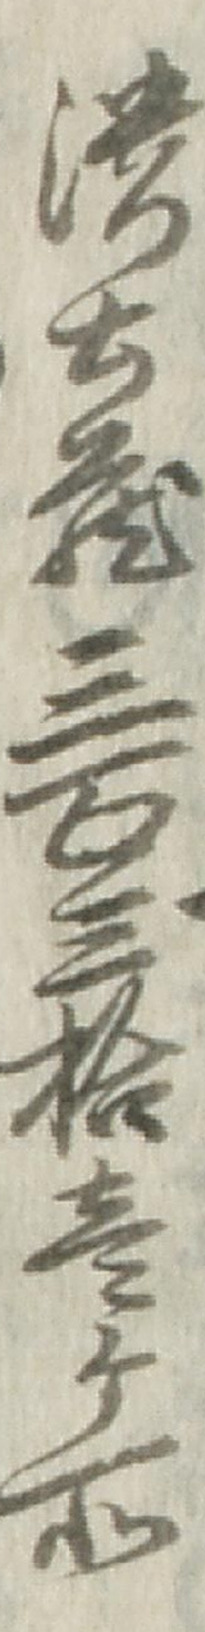潰土蔵三百三拾壱ヶ所
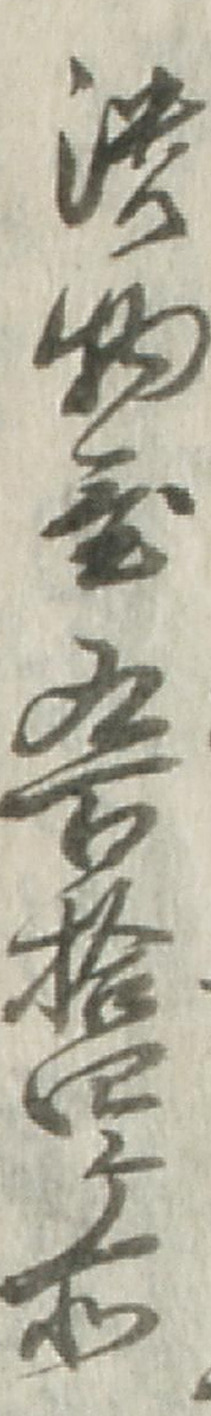潰物置九百拾四ヶ所
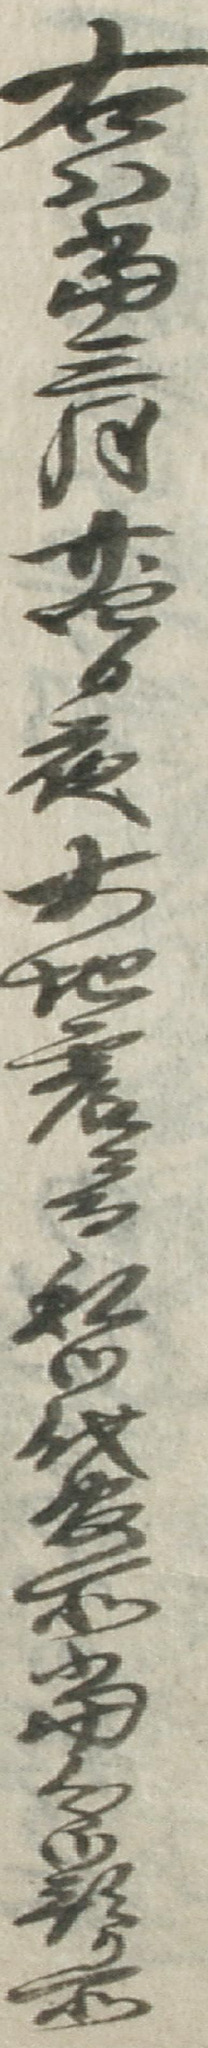右ハ当三月廿四日夜大地震二而私御代官所当分御預り所
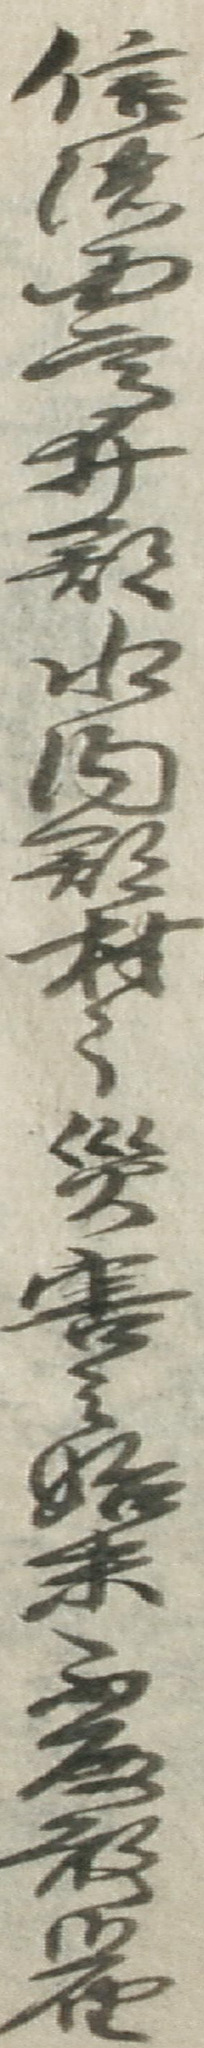信濃国高井郡水内郡村々災害之始末不取敢御届
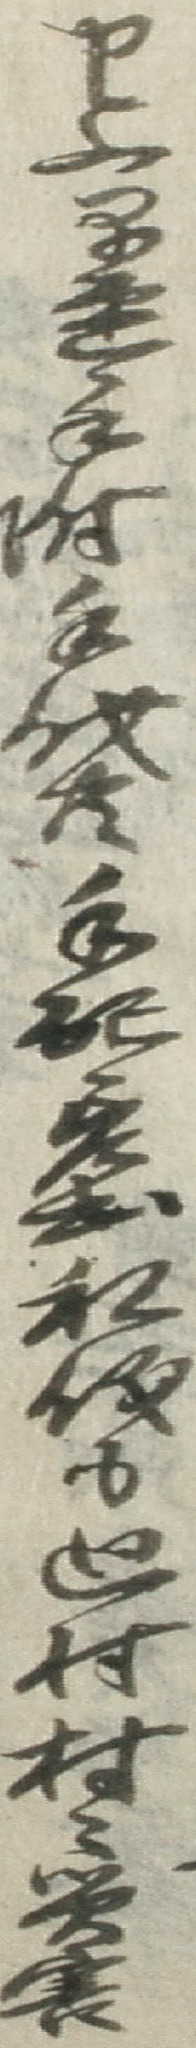申上早速手附手代共手配差出私儀も廻村村々災害
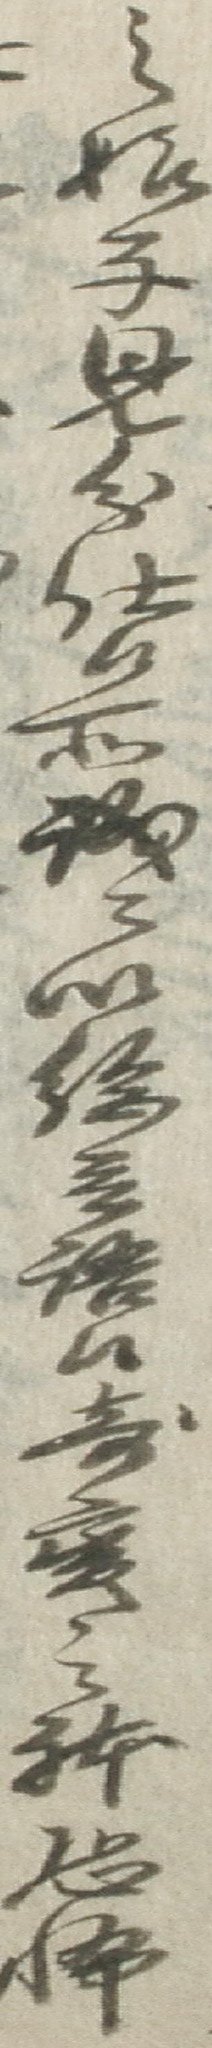之様子見分仕候所誠二以絶言語候奇変之躰恐怖
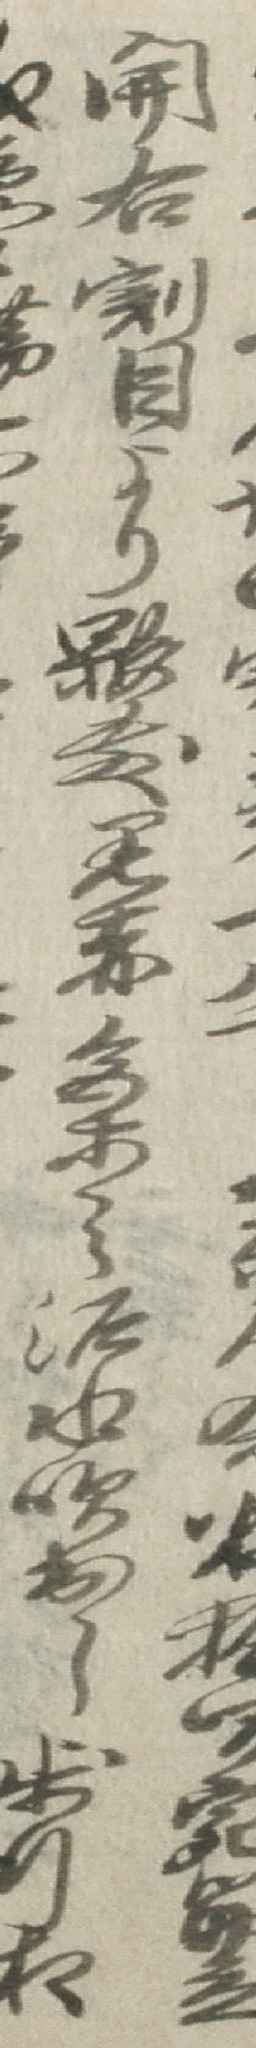開右割目ゟ夥敷黒赤色等之泥水吹出し歩行相
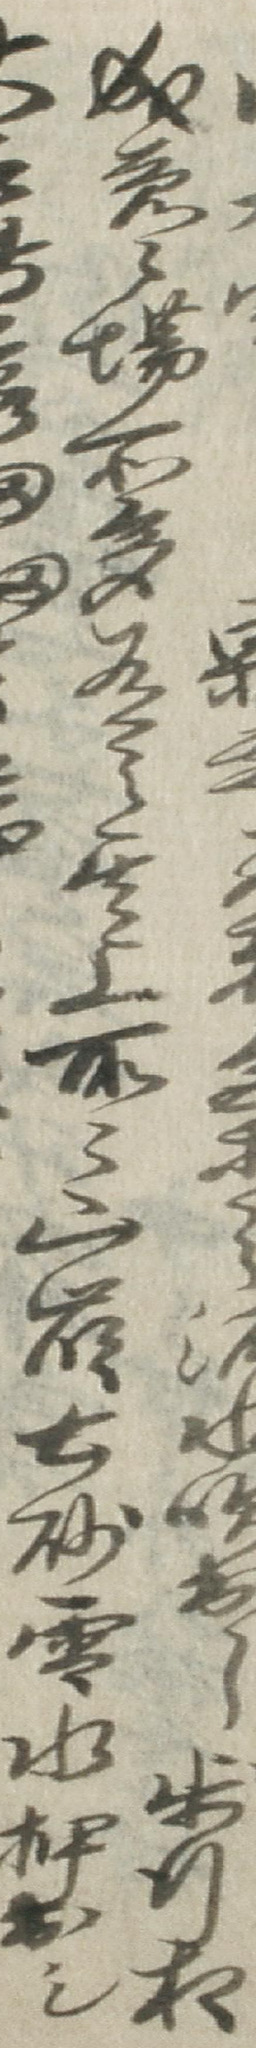成兼候場所多有之其上所々山崩土砂雪水押出ㇱ
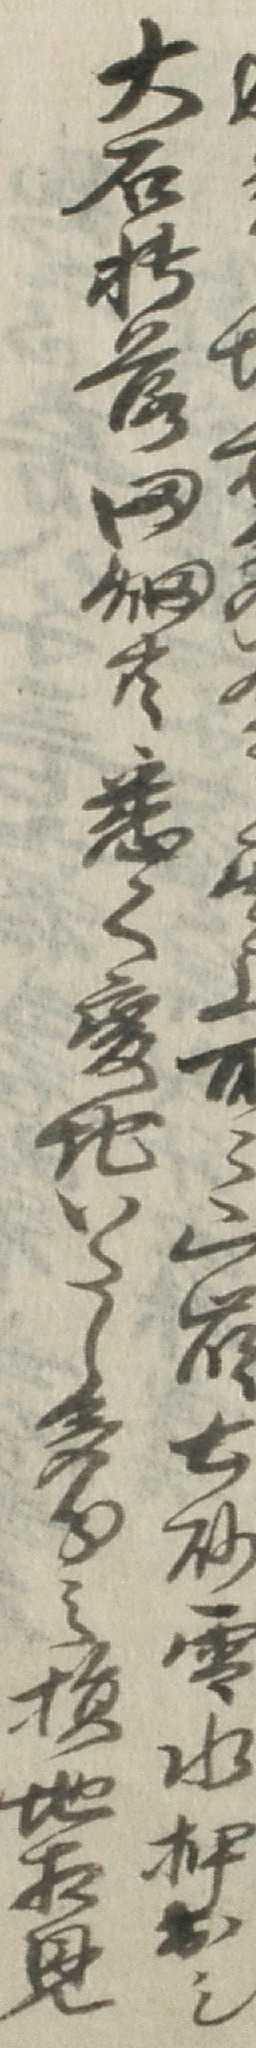大石転落田畑共悉く変地致し多分之損地相見
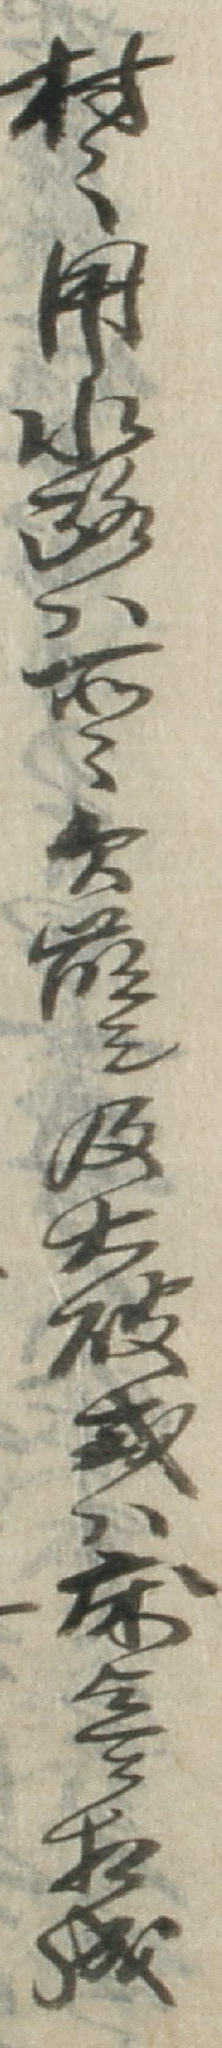村々用水路ハ所々欠崩ㇱ及大破或床迄二相成
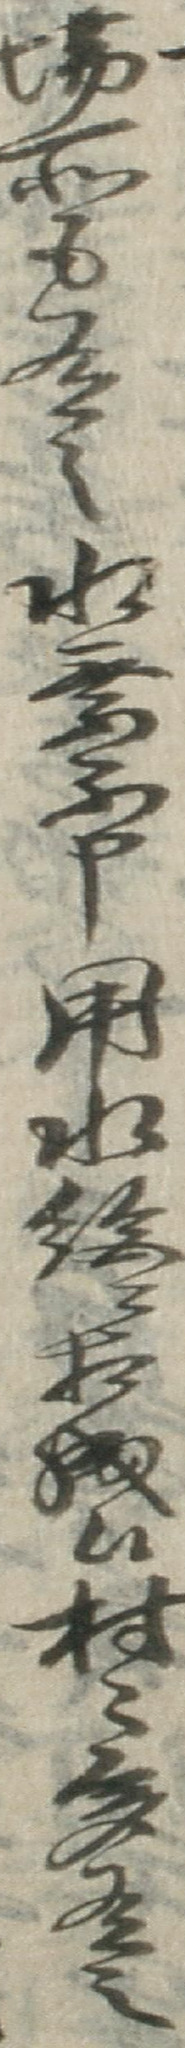場所も有之水乗不申用水絶二相成候村々多有之
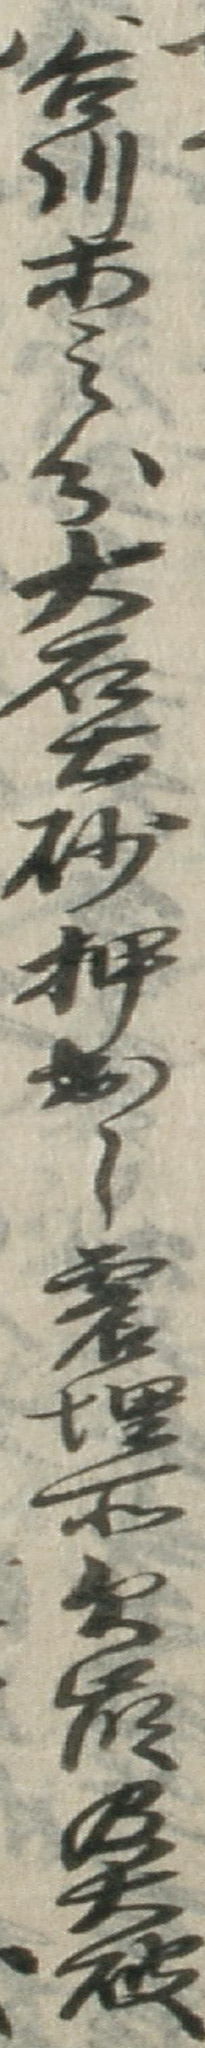谷川等之分大石土砂押出し震埋所欠崩及大破
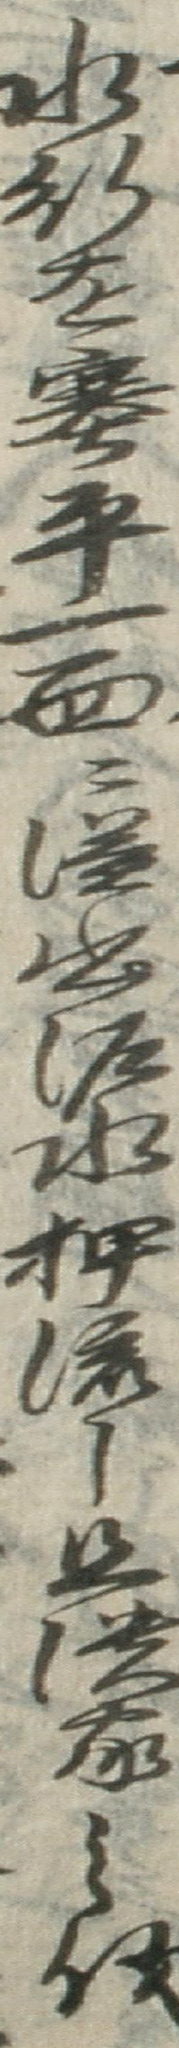水行を塞平一面二溢水泥水押流し且潰家之儀
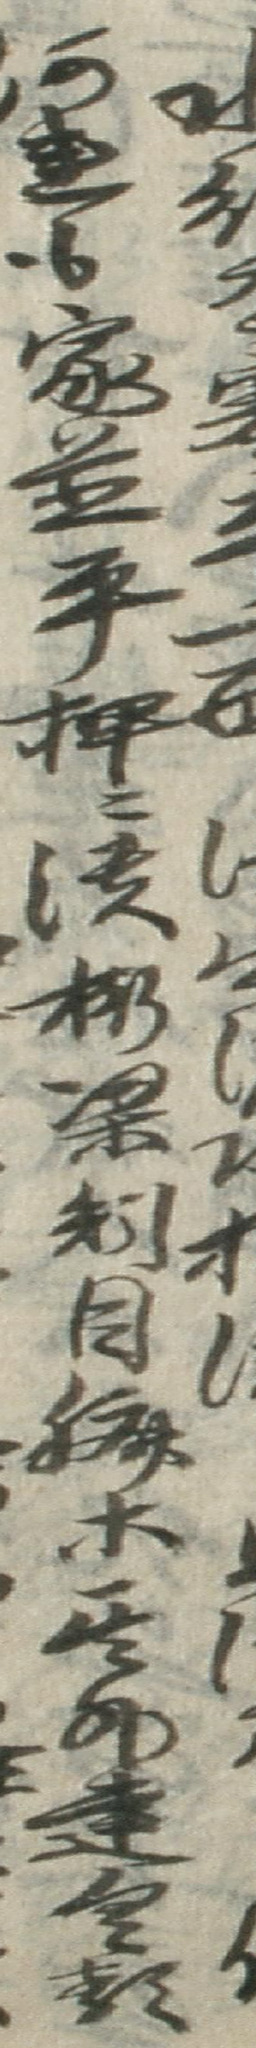何れも家並平押二潰桁梁矧目臍木其外建具類
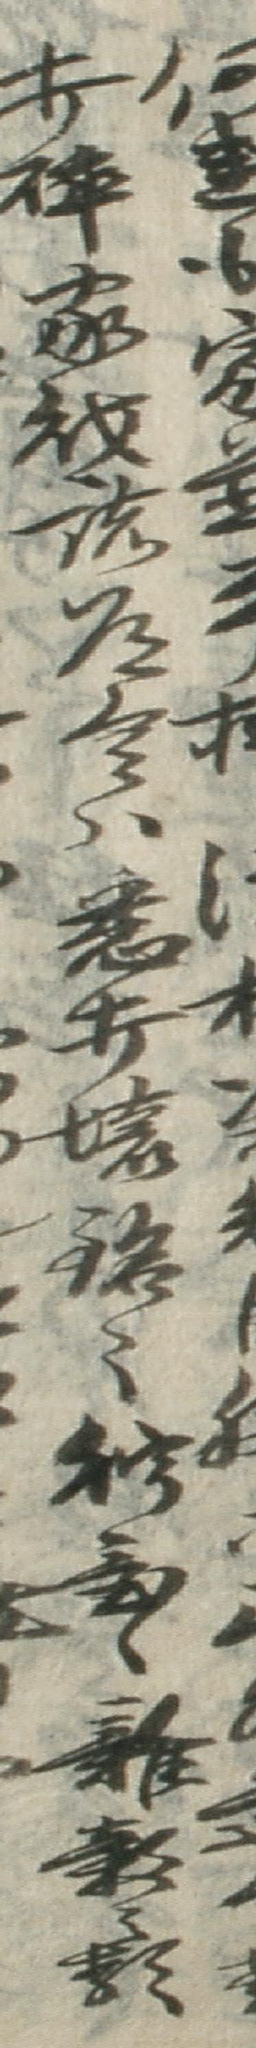打砕家財諸道具ハ悉打壊銘々貯置候雑穀之類
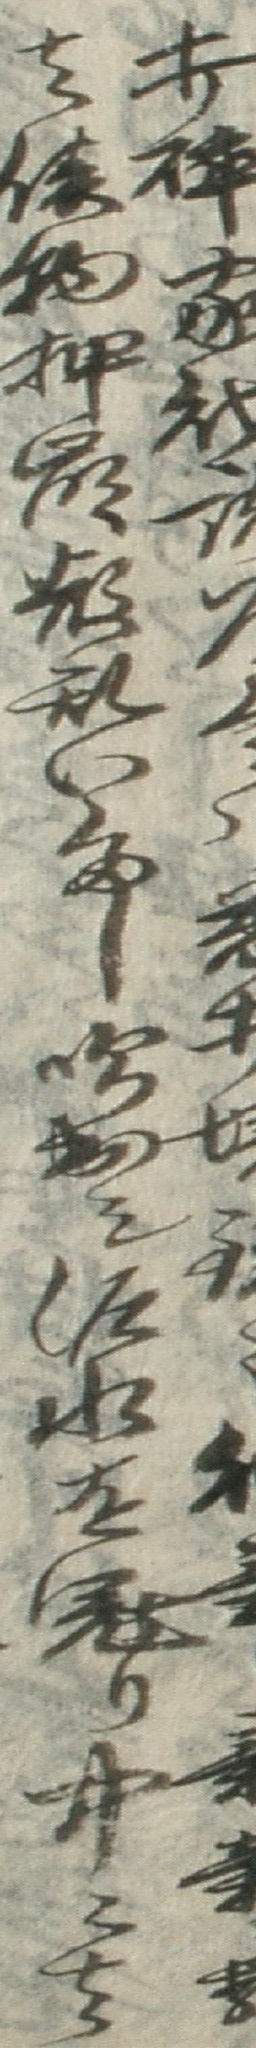は俵物押崩散乱いたし吹出ㇱ泥水ヲ冠り中二は
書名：信濃國地震實録記
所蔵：東京大学地震研究所図書室 Earthquake Research Institute Library, The University of Tokyo, JAPAN
